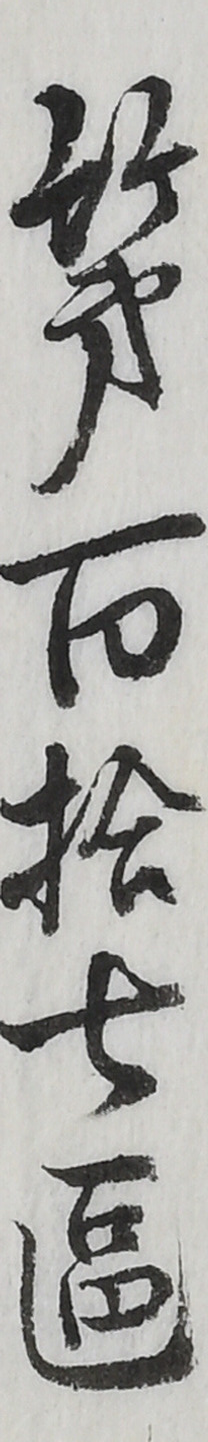第百拾七区
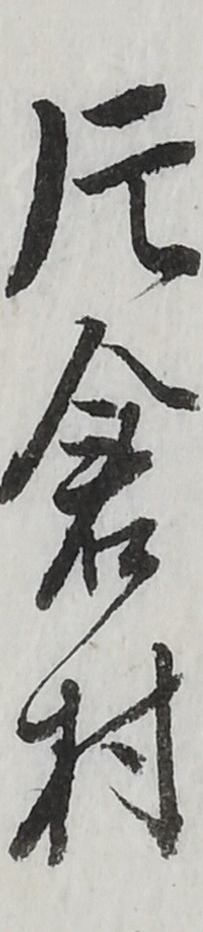片倉村
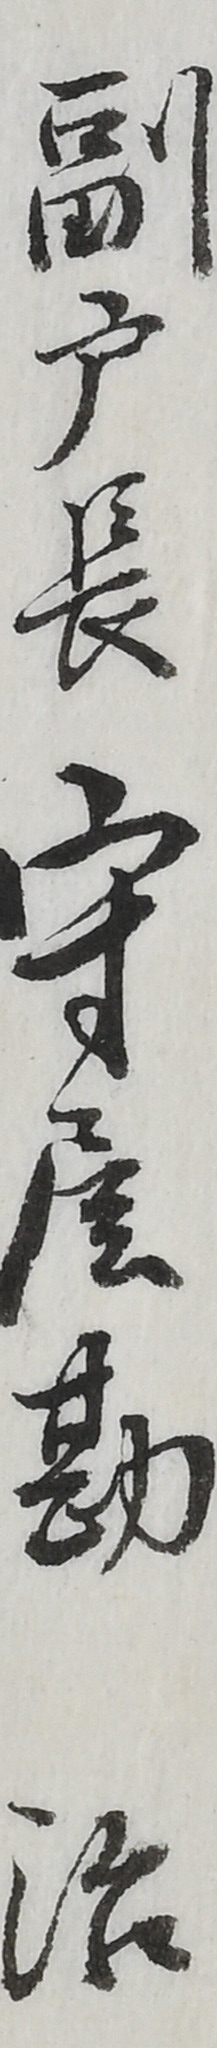副戸長守屋勘治
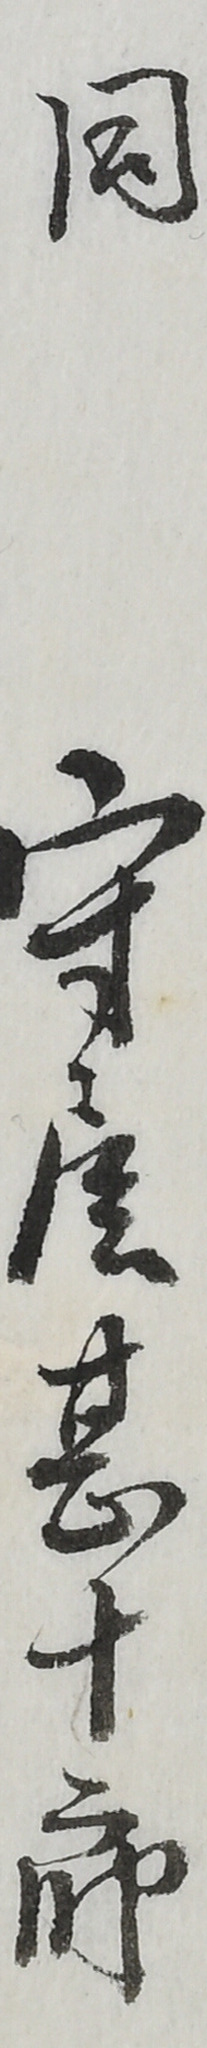同守屋甚十郎
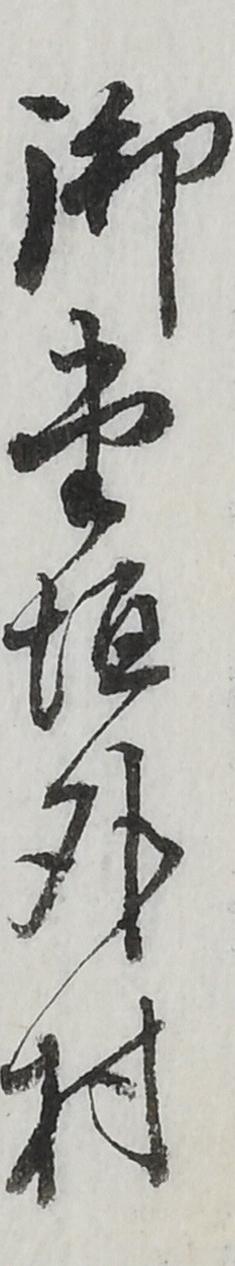御堂垣外村
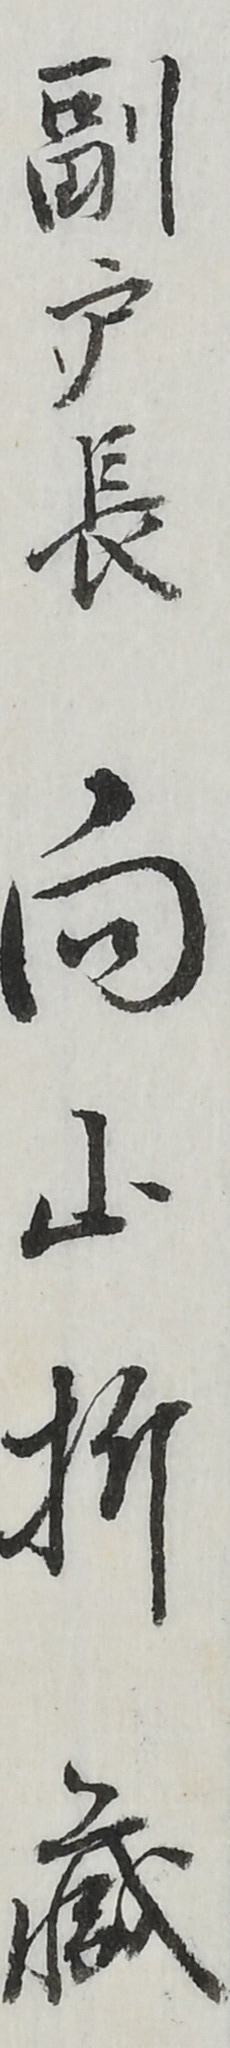副戸長向山折蔵

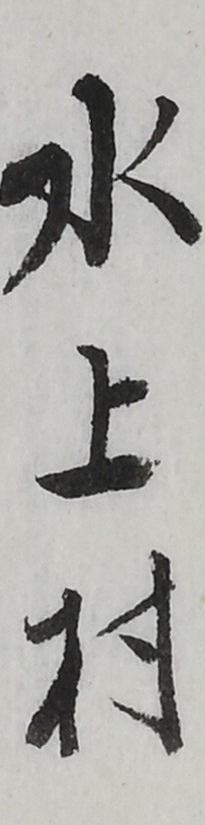水上村
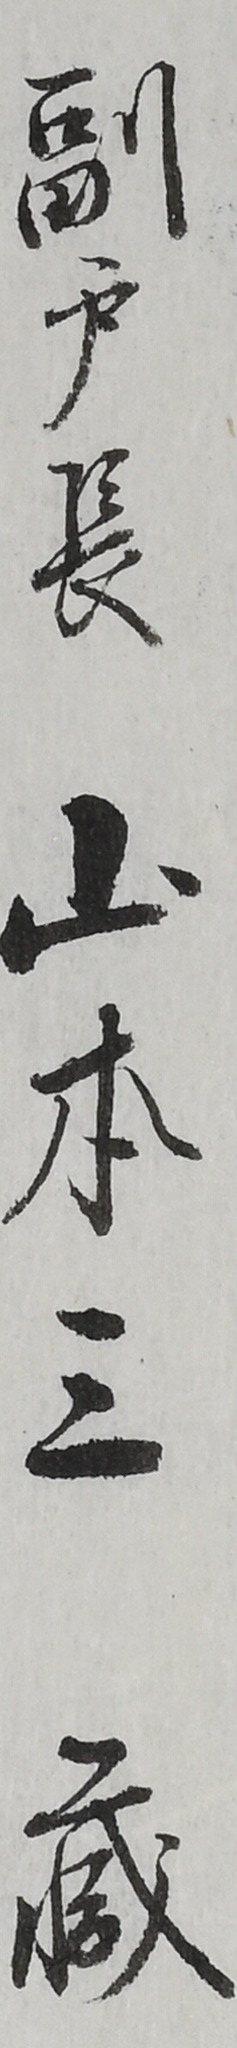副戸長山本三蔵
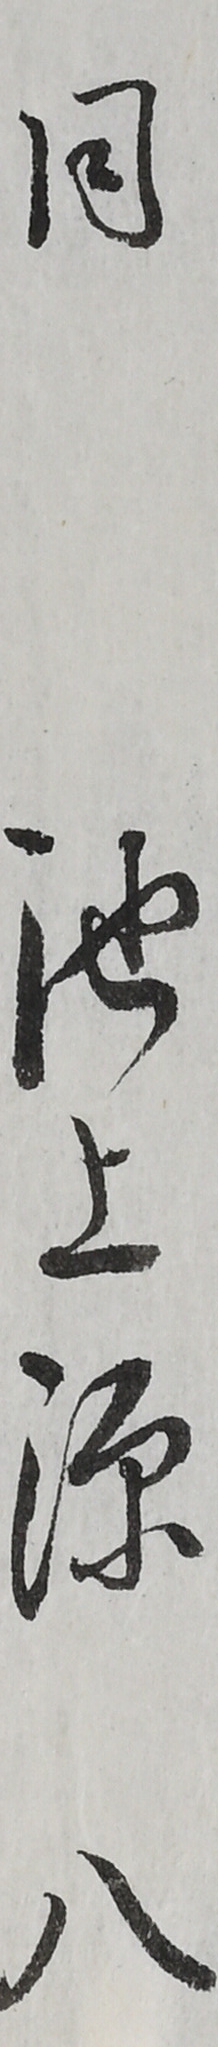同池上源八
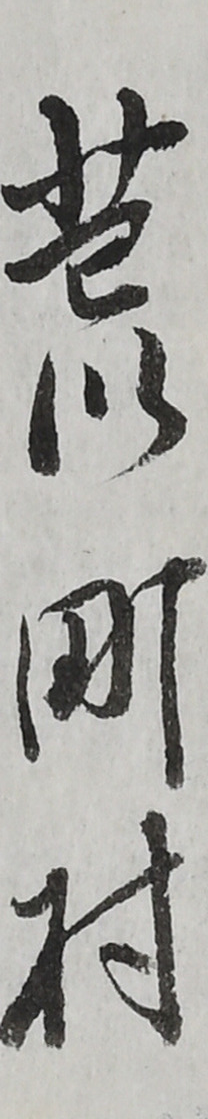荒町村
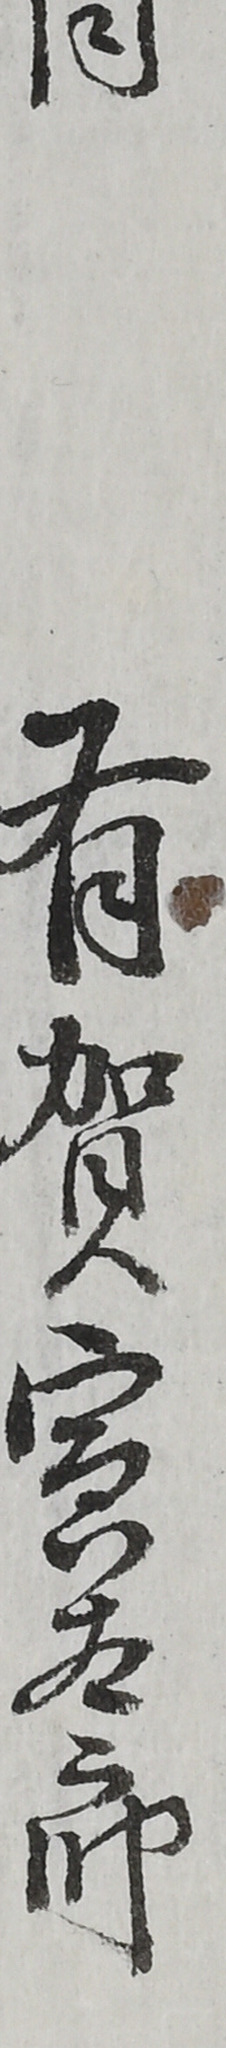同有賀寅太郎
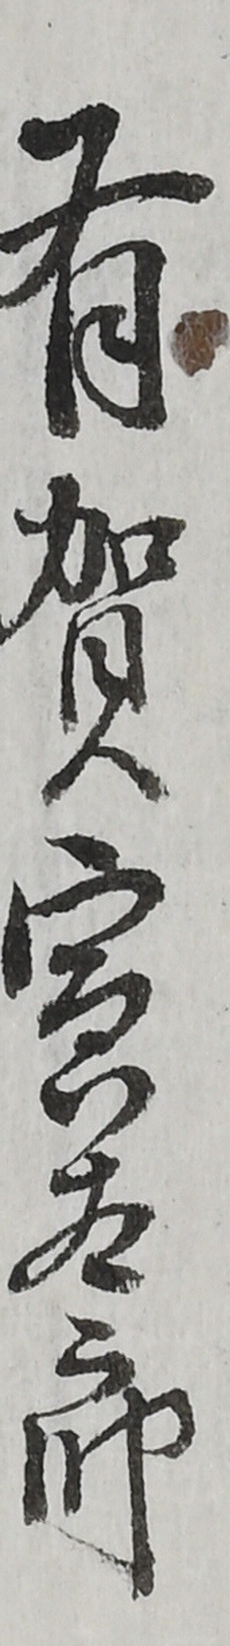同有賀寅太郎
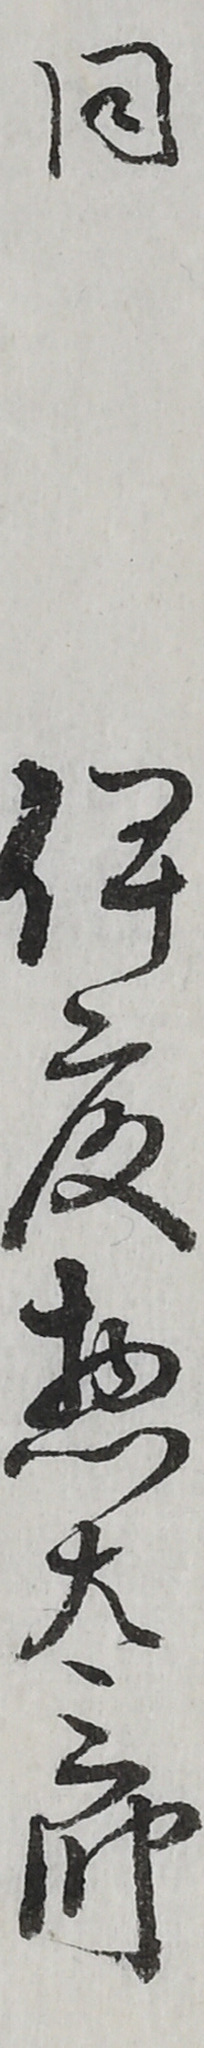同伊藤惣太郎
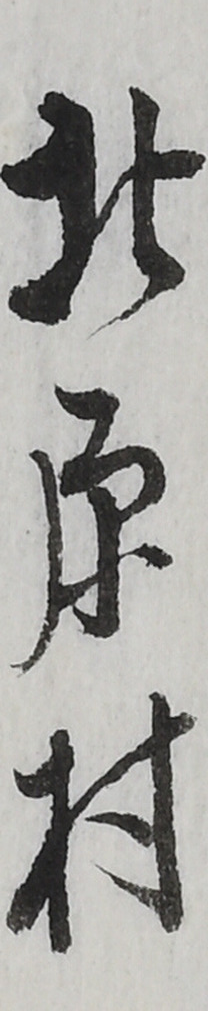北原村
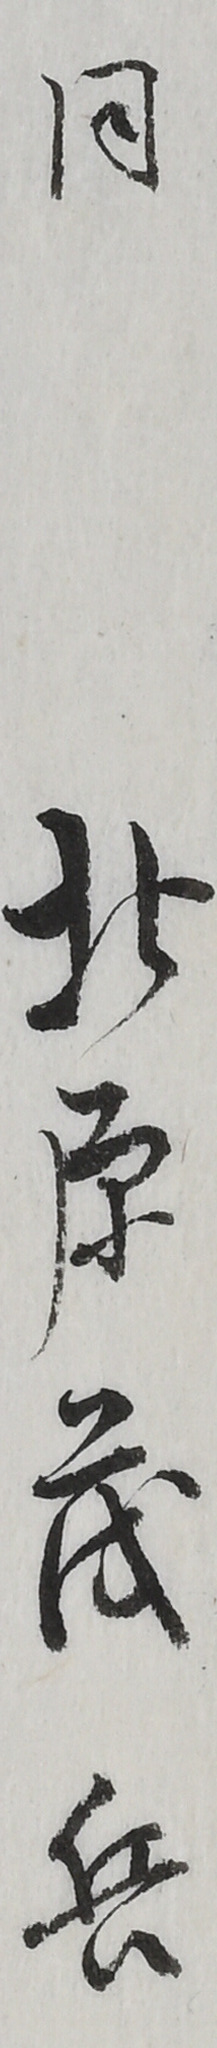同北原茂兵
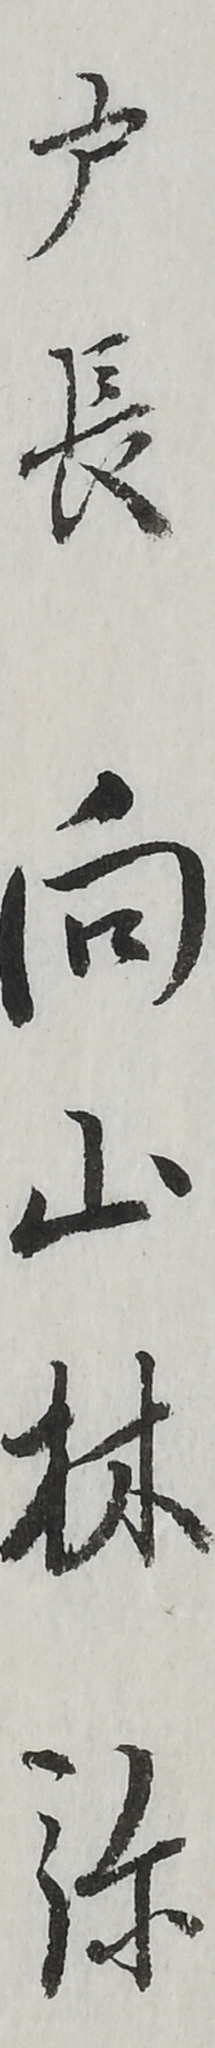戸長向山林弥
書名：伊那郡毎村戸長副戸長名簿
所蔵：伊那市立高遠町図書館・合同会社AMANE
